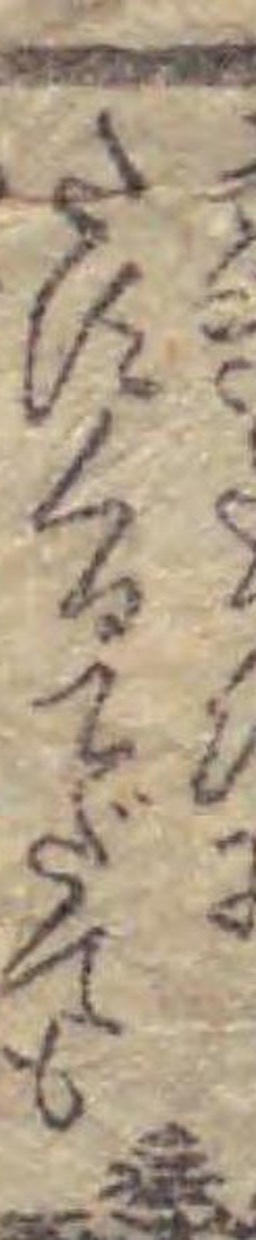たすくるてだても
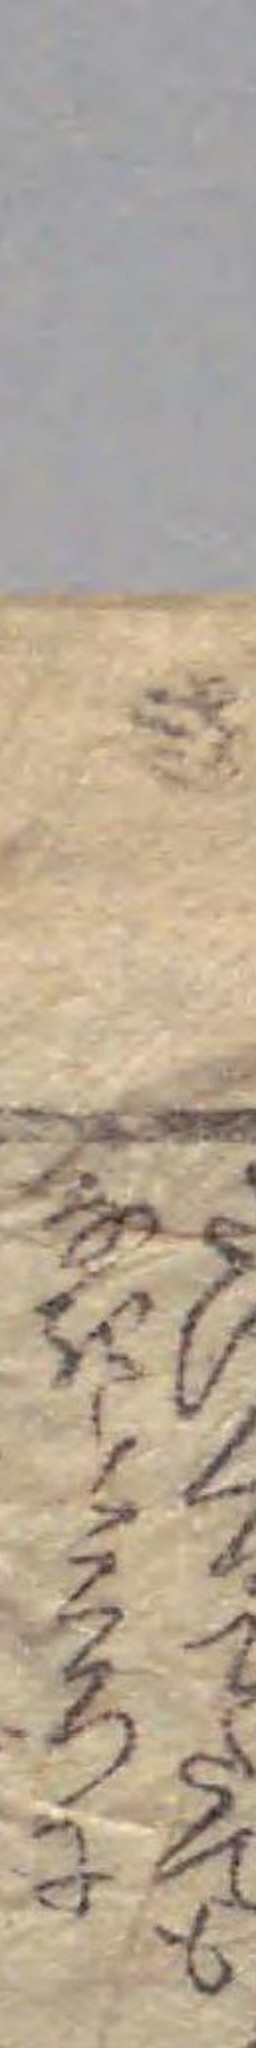なきところに
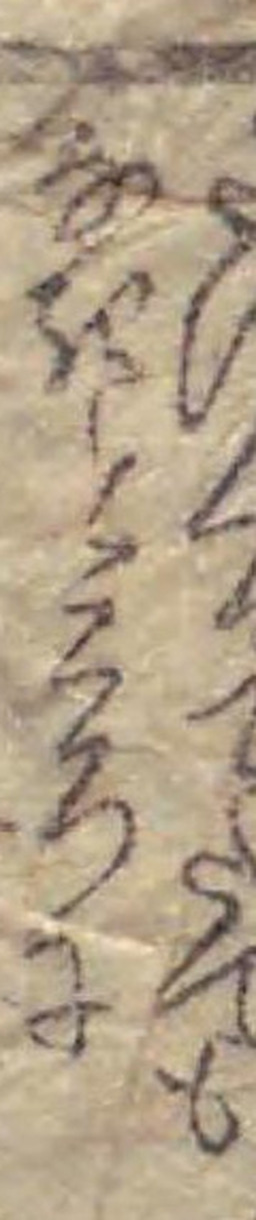なきところに
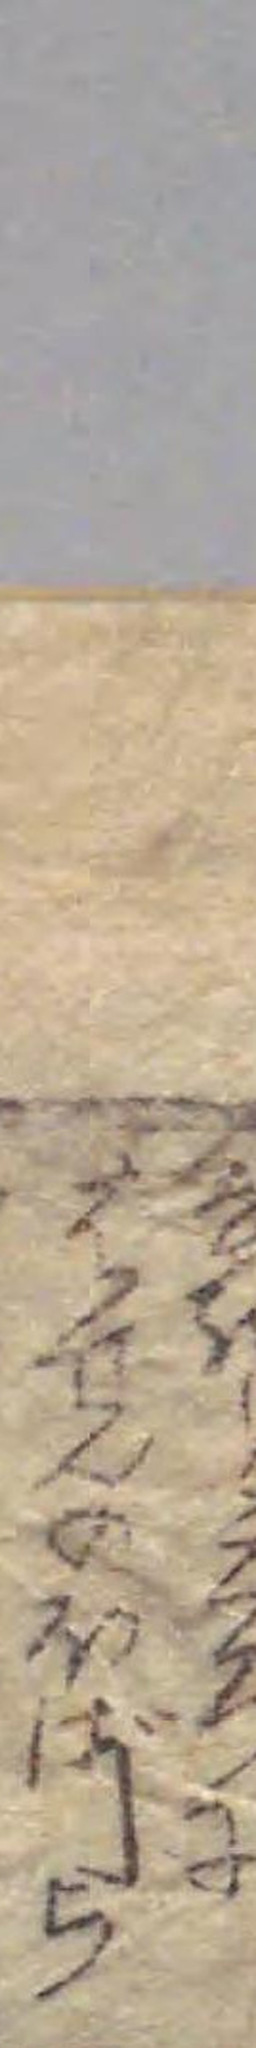はせんのほばしら
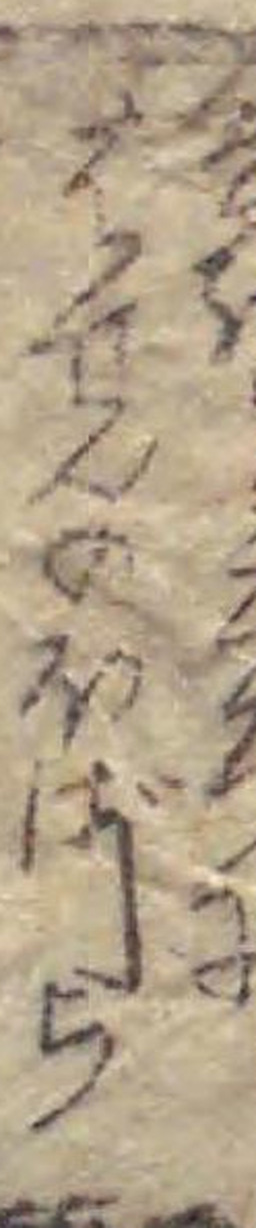はせんのほばしら
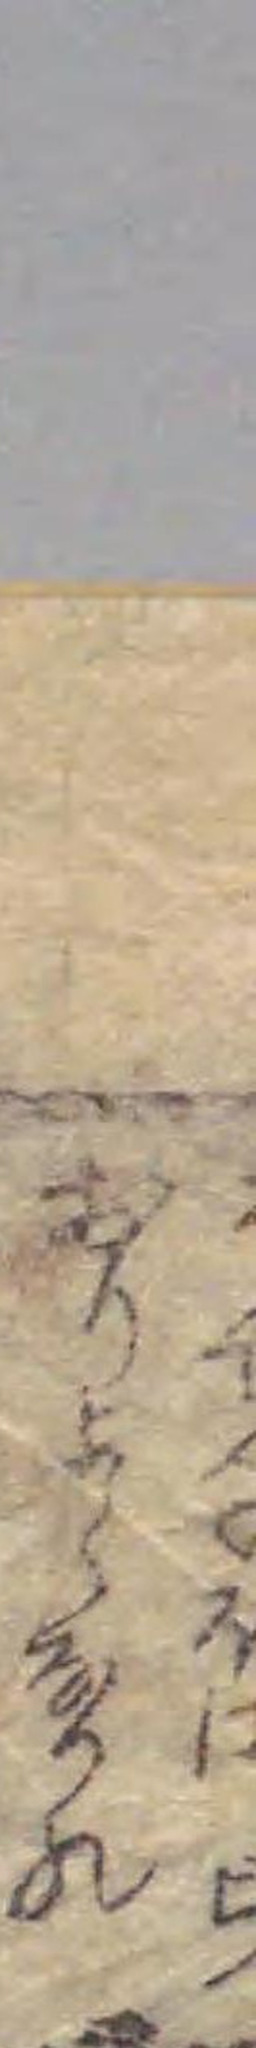おりよくなかれ
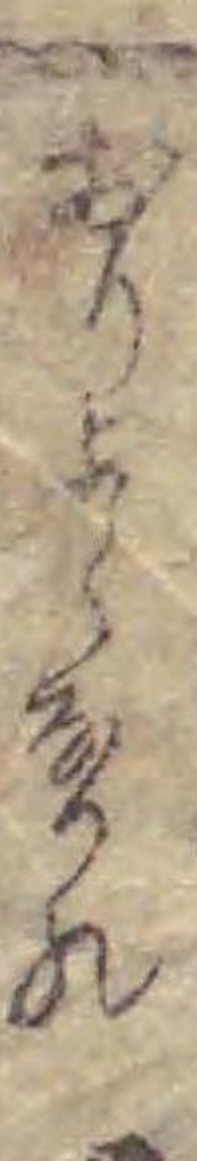おりよくなかれ
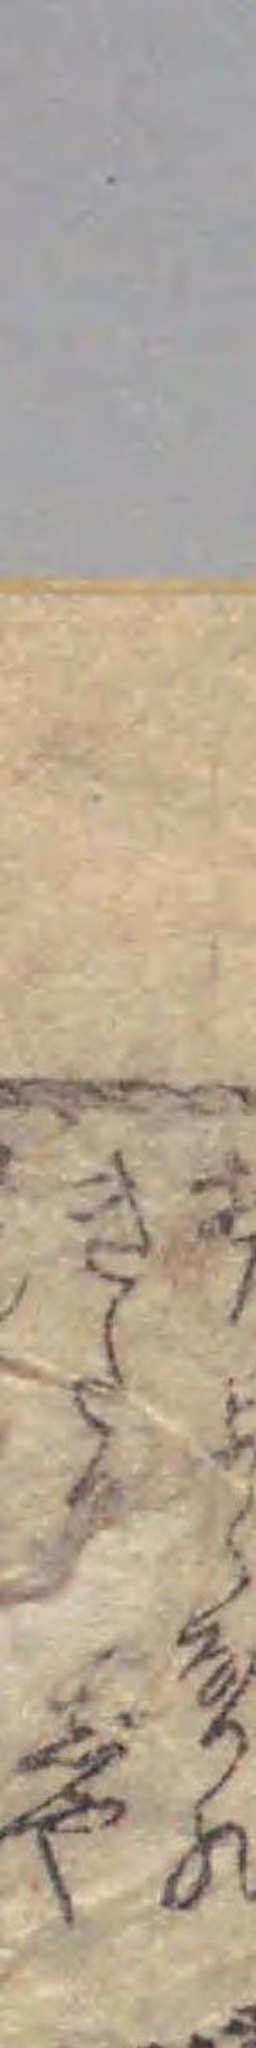きたるじや
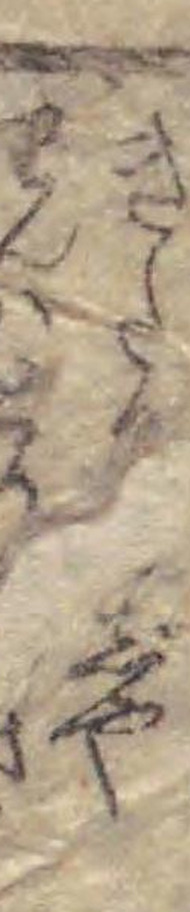りんはとき
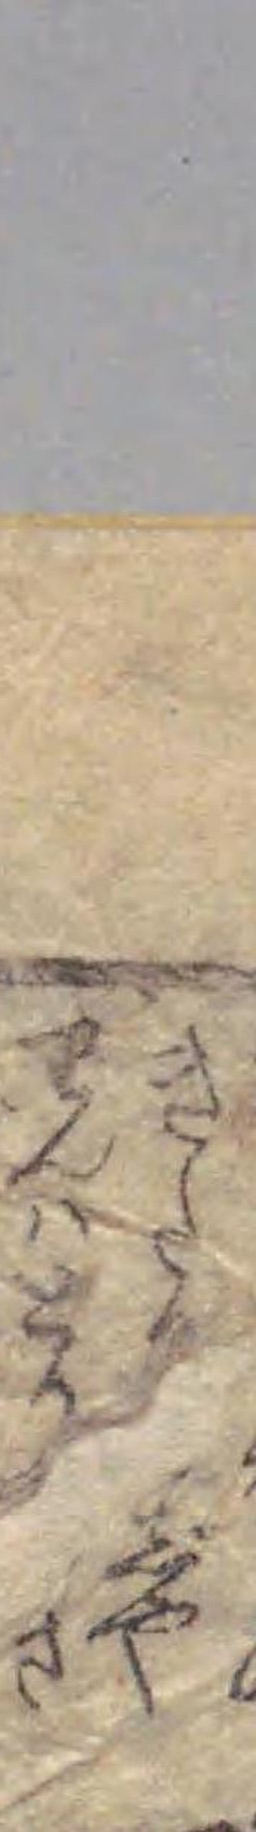りんはとき
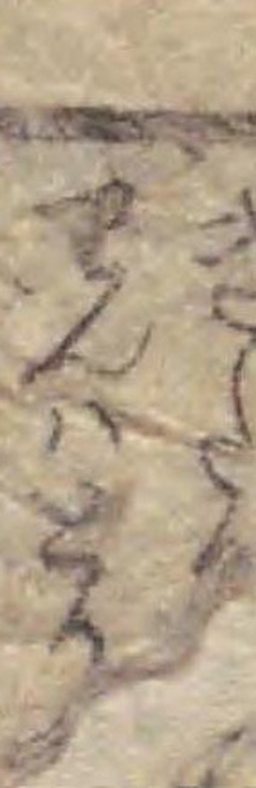りんはとき
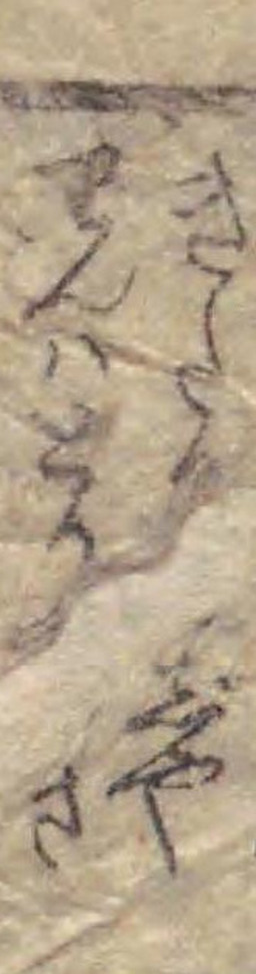りんはとき
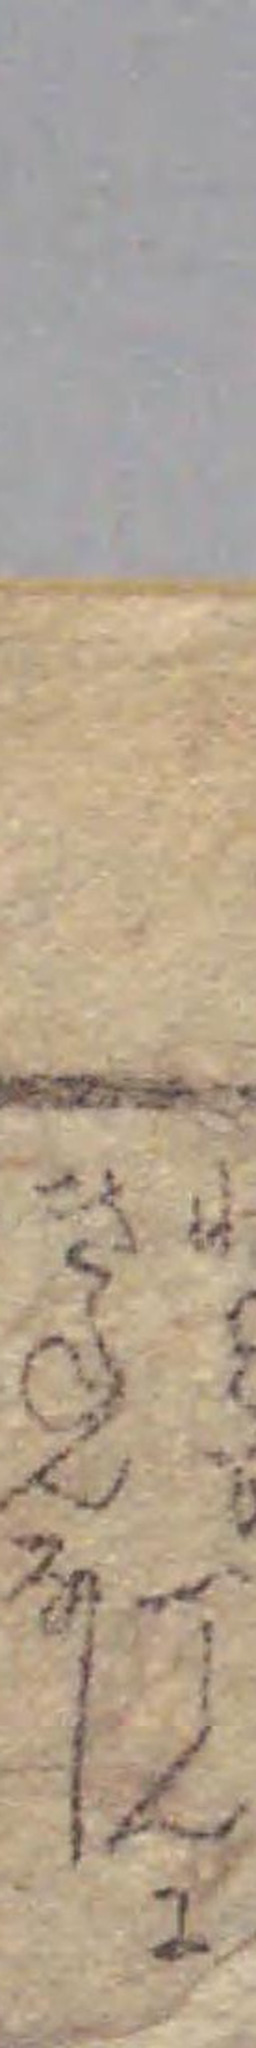きねんなし
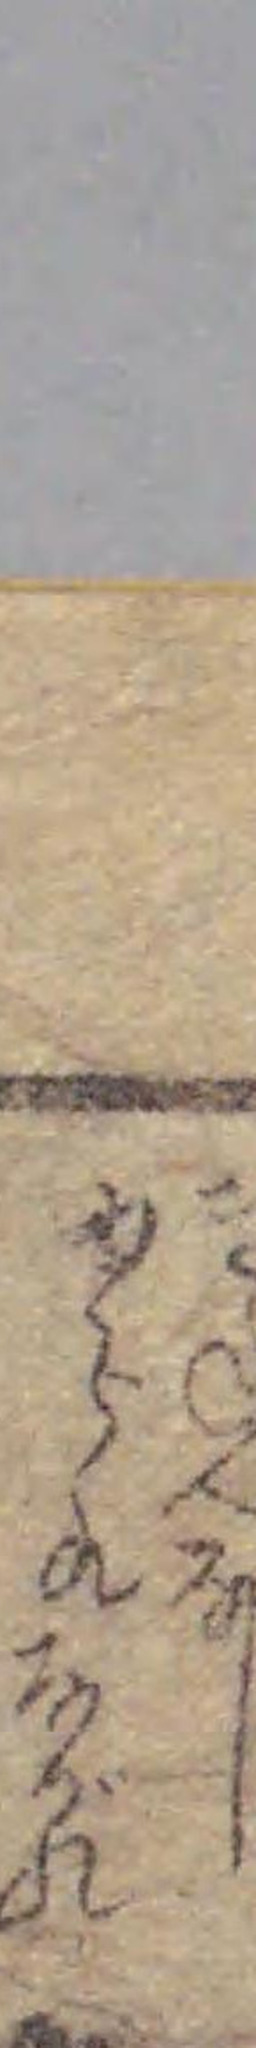ゆられながれ
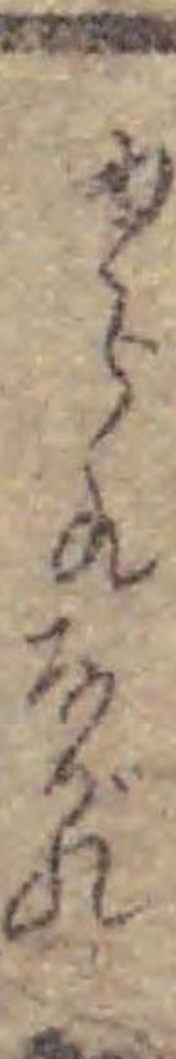ゆられながれ
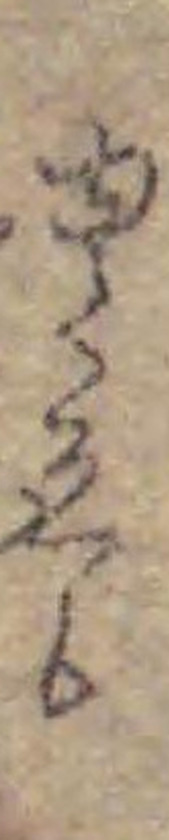ゆくゑも
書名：化物世界夜半嵐 : 3巻
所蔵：国立国会図書館 National Diet Library, JAPAN
